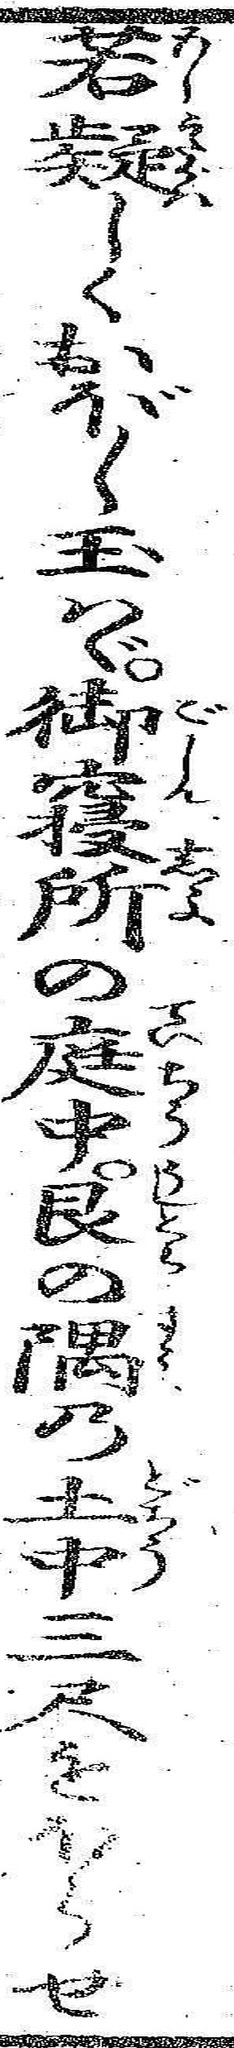若疑しくおぼし玉はゞ。御寝所の庭中。艮の隅の土中三尺をほらせ
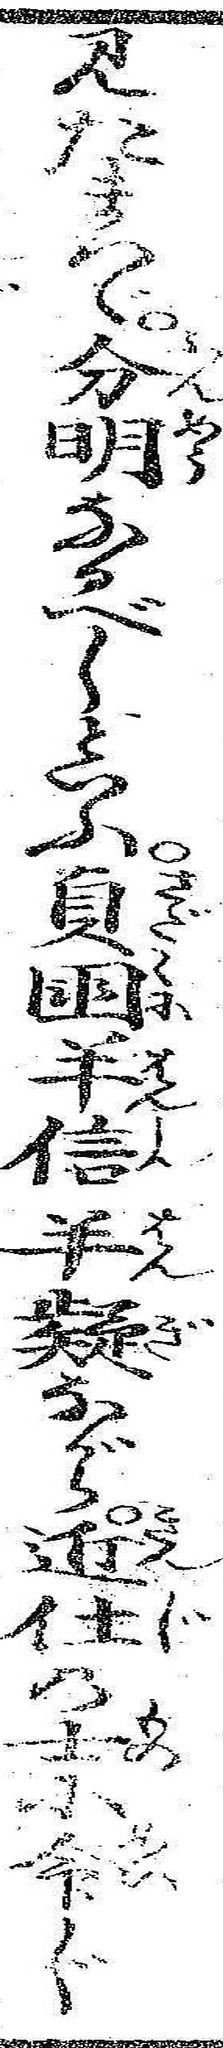見たまはゞ。分明なるべしといふ。貞国半信半疑ながら。近仕の士に命じ
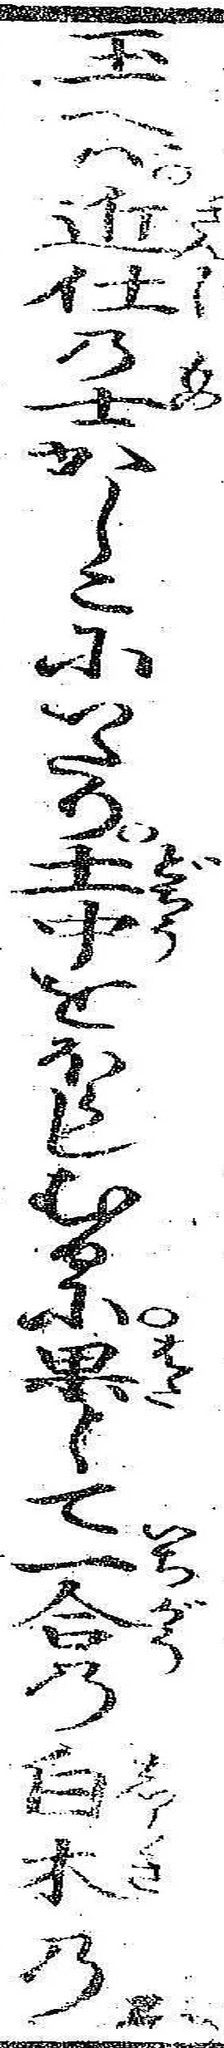玉へば。近仕の士かしこにいたり。土中をほらしむるに。果して一合の白木の
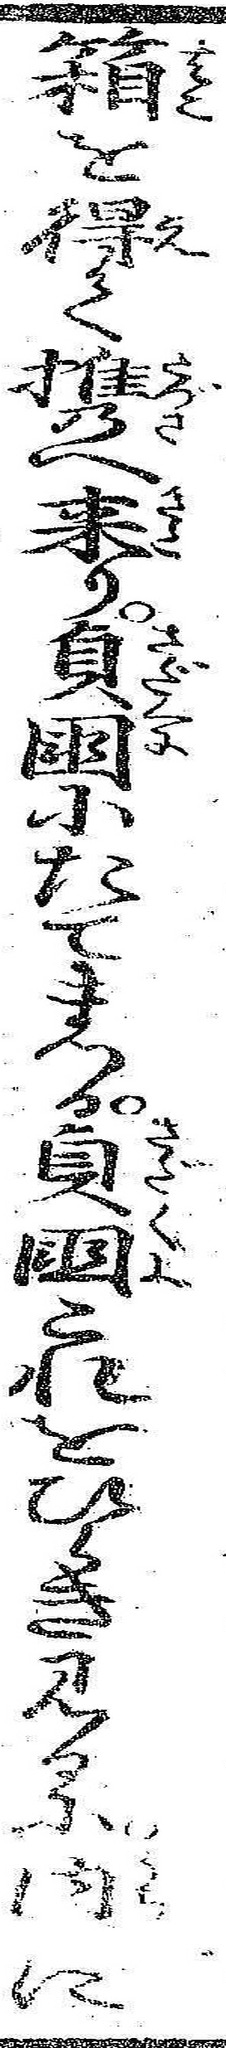箱を得て携へ来り。貞国にたてまつる。貞国これをひらき見るに。内に
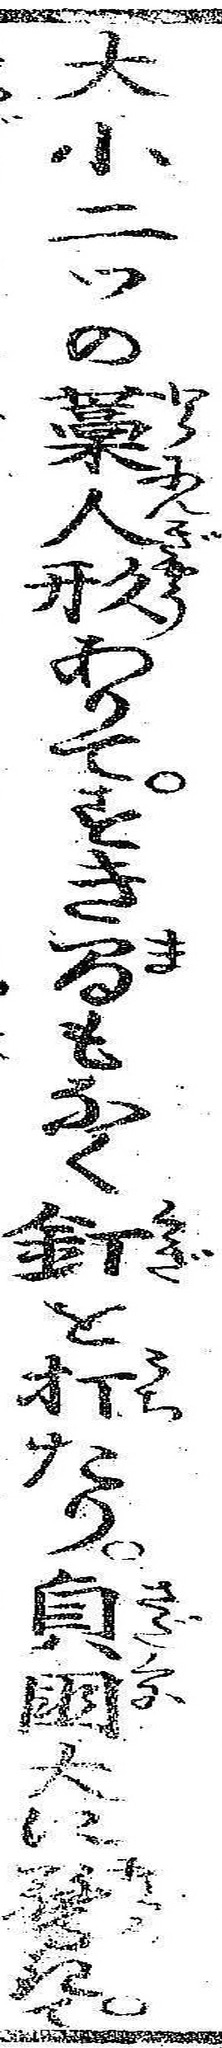大小二ツの藁人形ありて。すき間もなく釘を打たり。貞国大に驚きて。
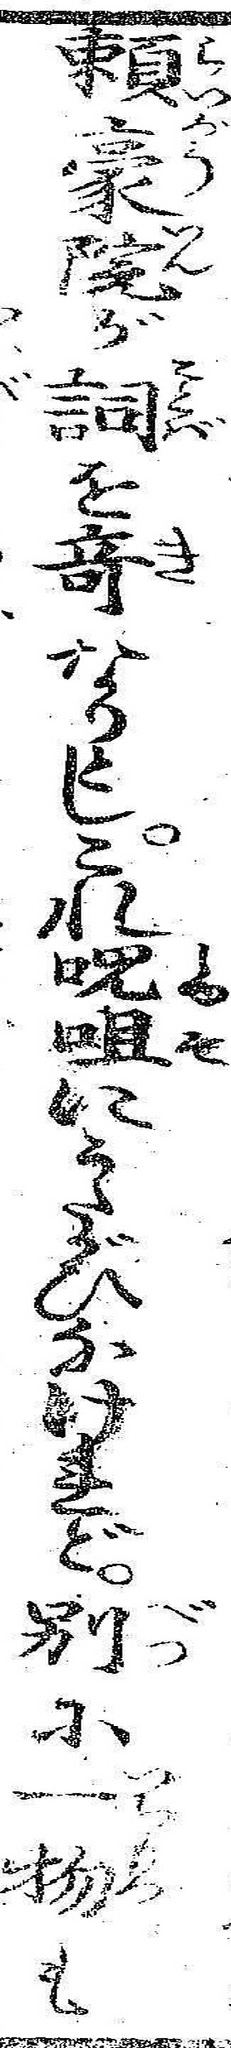頼豪院が詞を奇なりとし。これ呪咀にうたがひなけれど。別に一物も
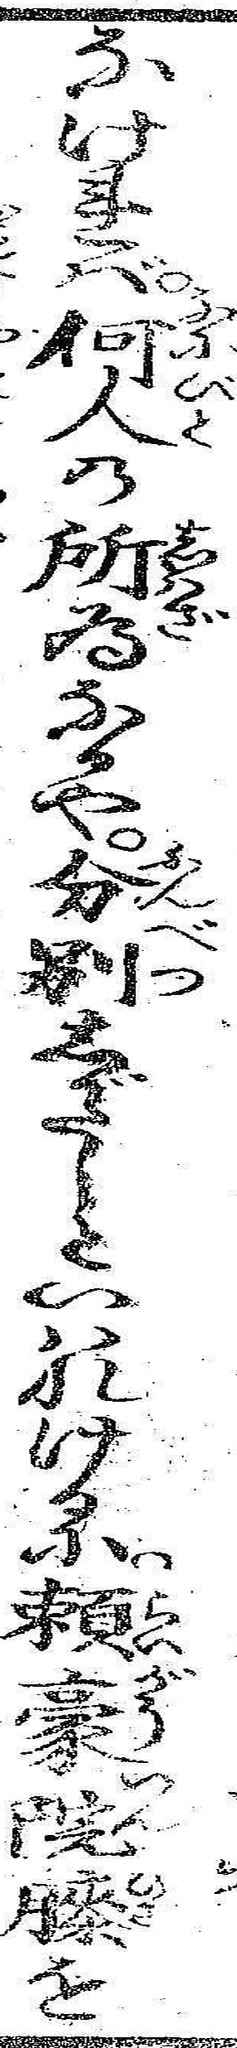なければ。何人の所為なるや。分別しがたしといはれけるに。頼豪院膝を
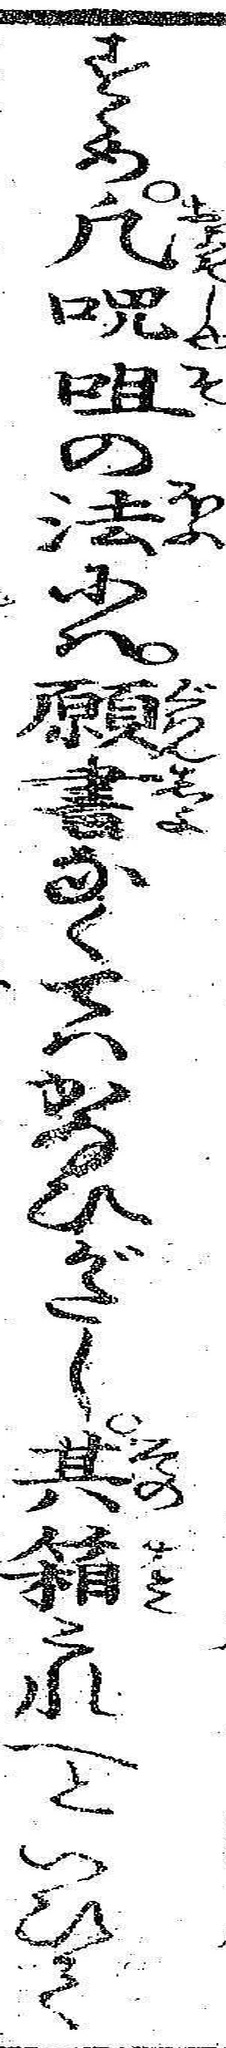すゝめ。凡呪咀の法には。願書なくてはかなひがたし。其箱これへといひて
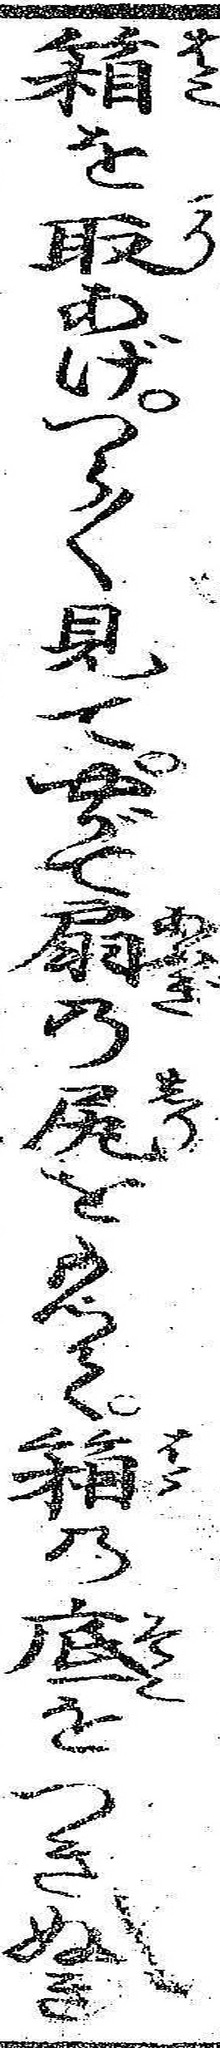箱を取あげ。つら〳〵見て。やがて扇の尻をもつて。箱の底をつきぬき
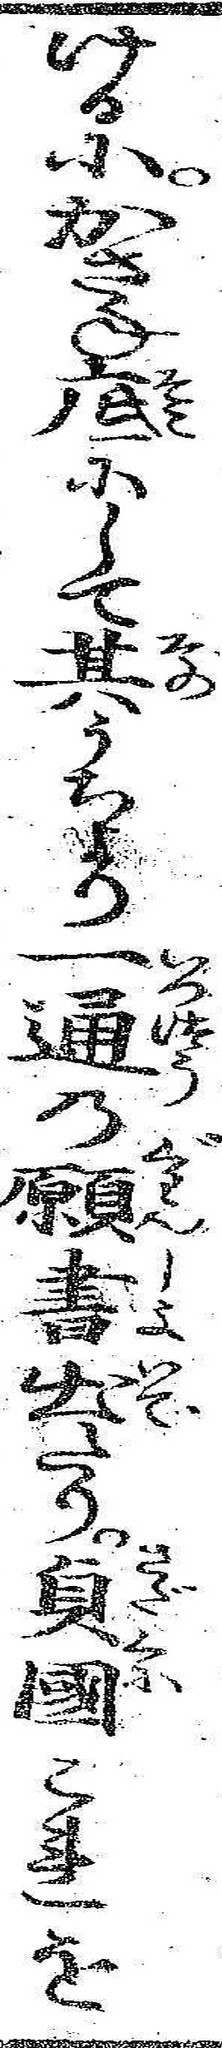けるに。かさね底にして其うちより一通の願書出たり。貞国これを

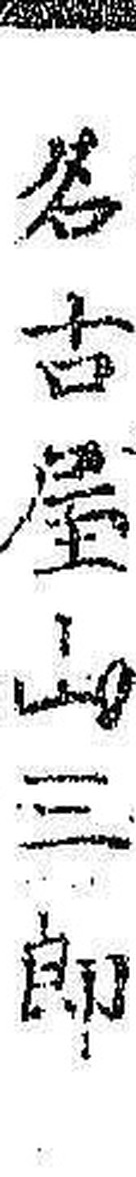名古屋山三郎
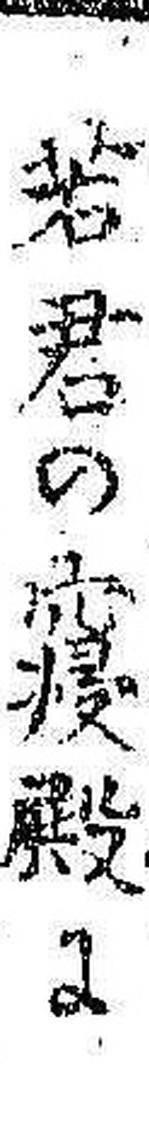若君の寝殿に
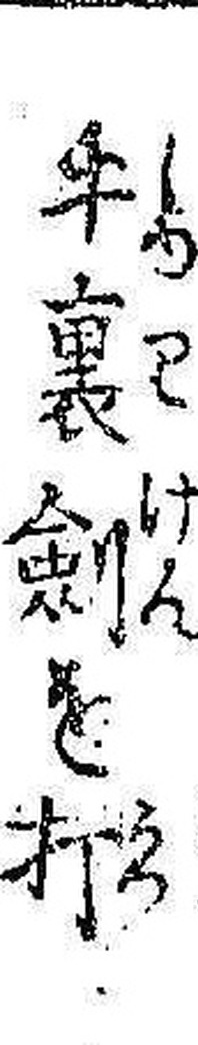手裏剣を打
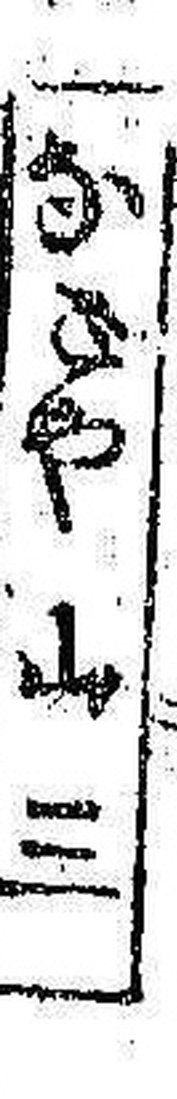なごや山三
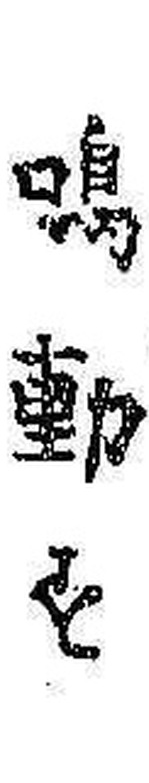鳴動す
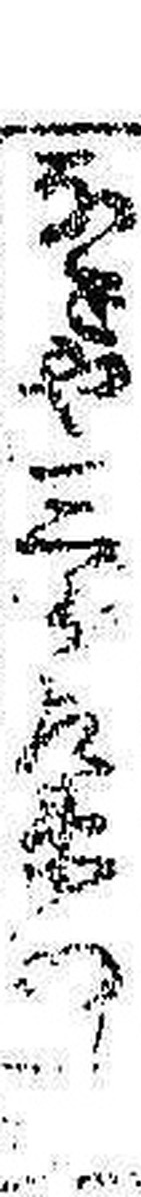なごや三郎左衛門
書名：昔話稲妻表紙
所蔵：国文学研究資料館
